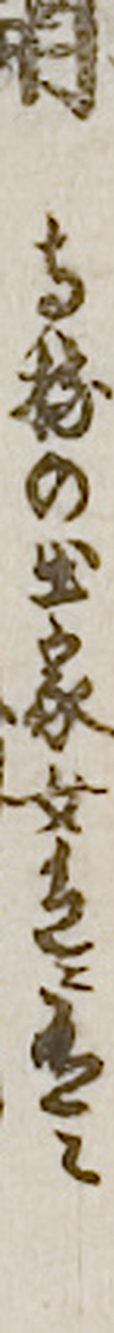寺稼の出家女色に有に
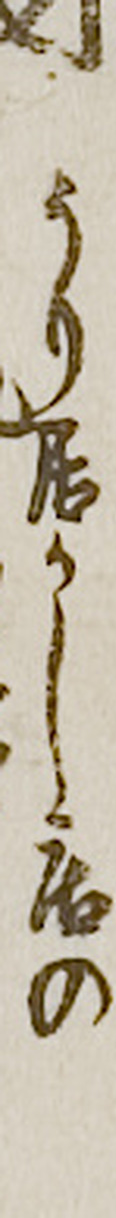うり居かし店の
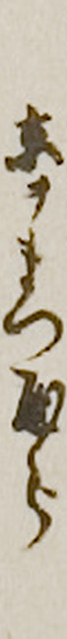末をまつやら
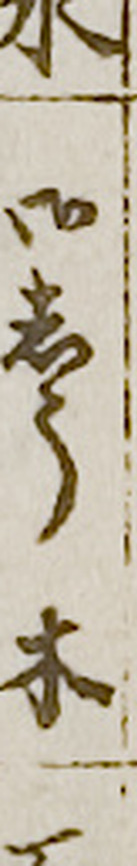六御しう木
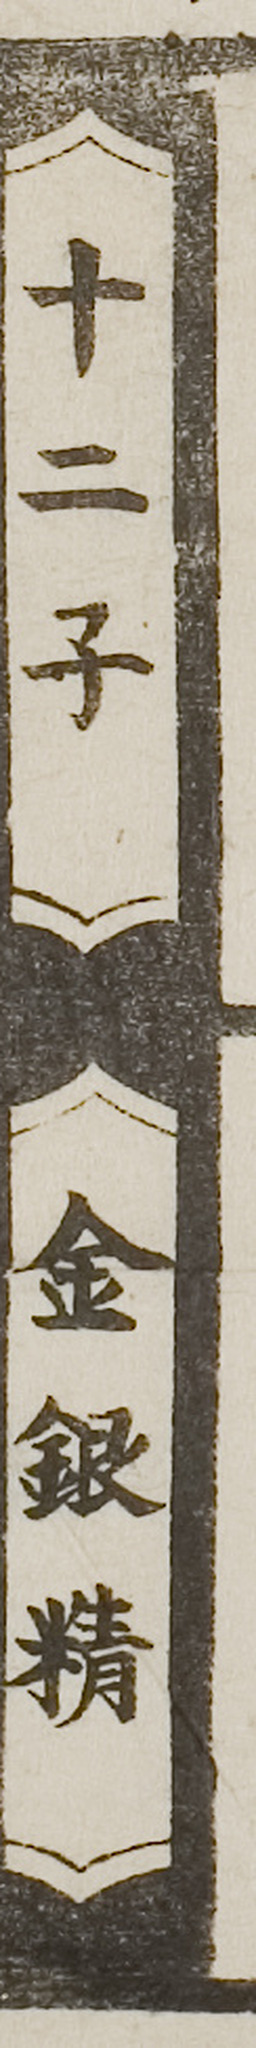金銀精
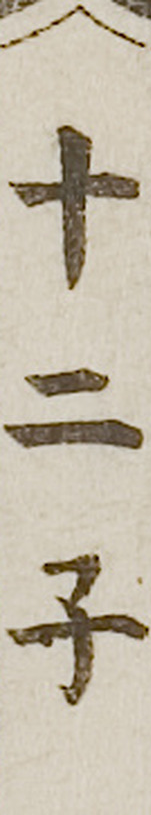十二子
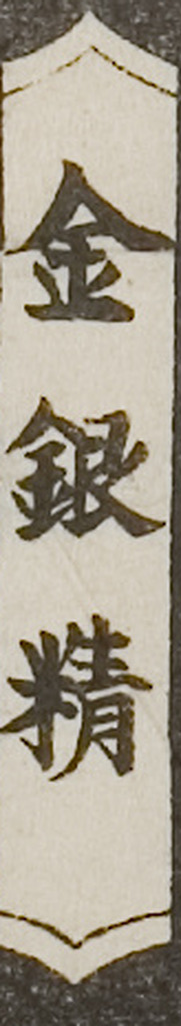金銀精
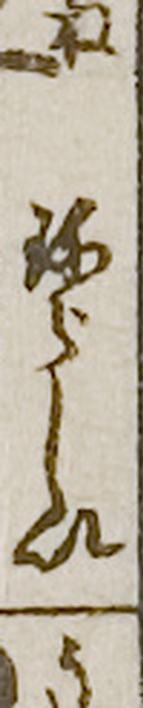珍らしい
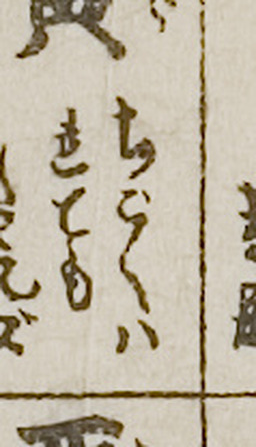ぢごくは
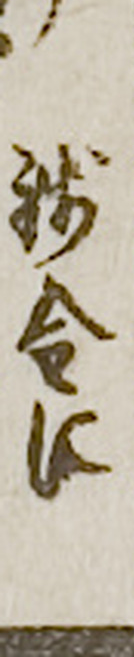銭金に
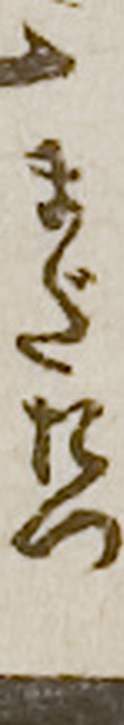まだたつ
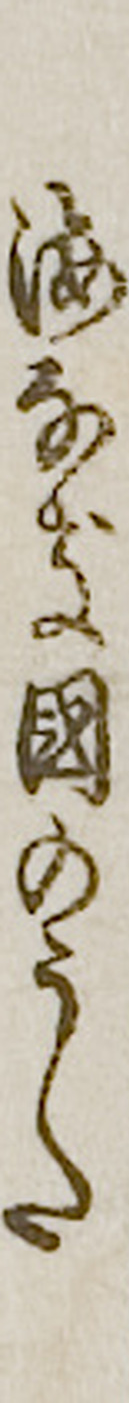海なき国のうた
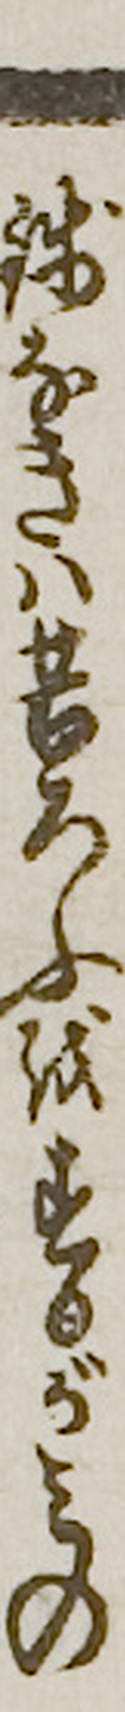銭なきは苦ろふをするがみの
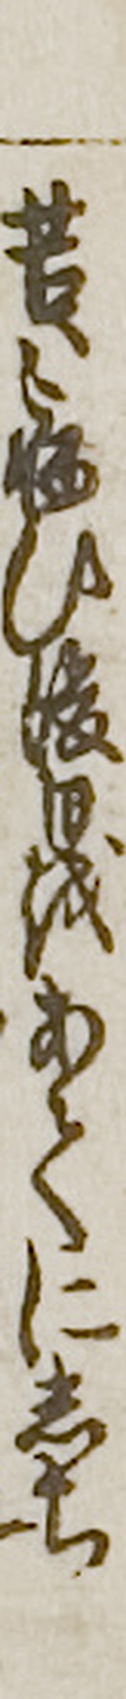苦い悔ひ後日をあてにしち
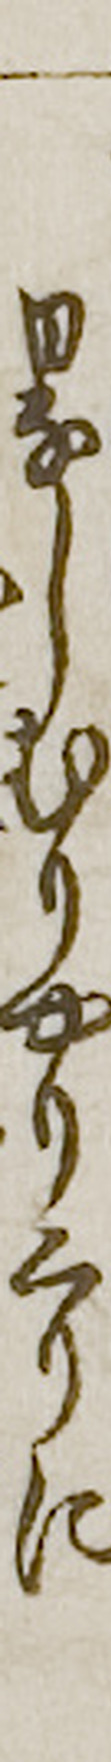日なしむりやりくりに
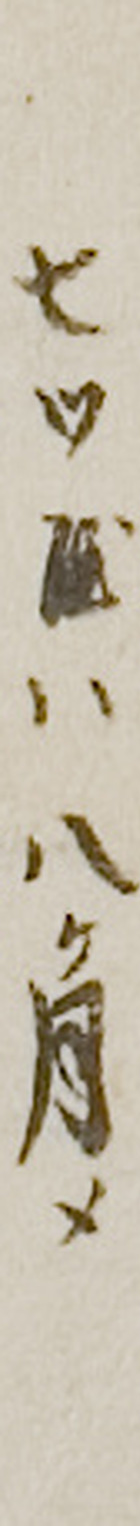七つ屋は八ヶ月〆
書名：天保改勢珍説増補鯰年代雑記
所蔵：東京大学総合図書館 General Library in the University of Tokyo, JAPAN
